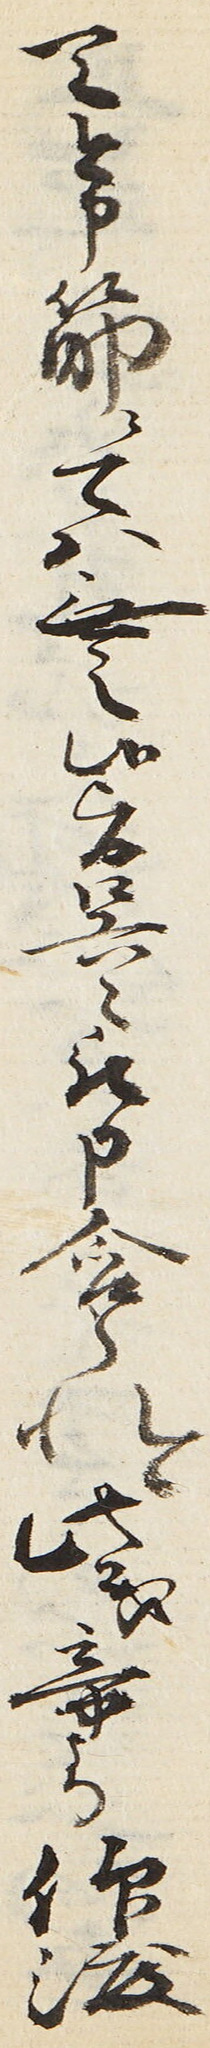てと申筋にては無之候旨呉々被申会られ候此義帝より仰渡
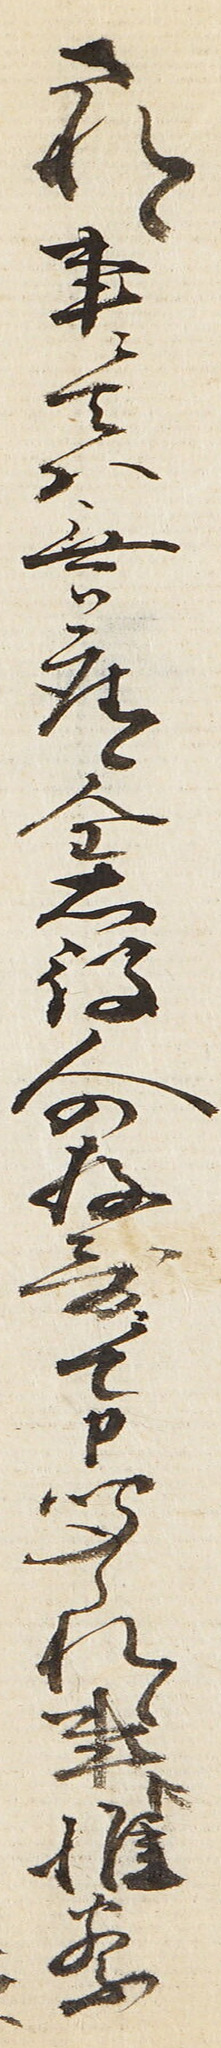され候事にては無御座候全右役人の存寄にて申聞れ候事に推察仕候
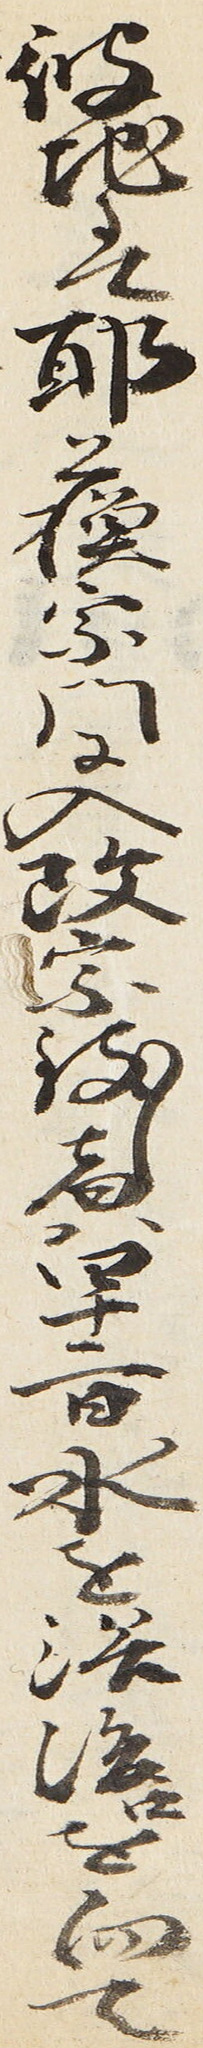彼地にて耶蘇宗門に入改宗致し者は四十二日水を浴後ロを向て
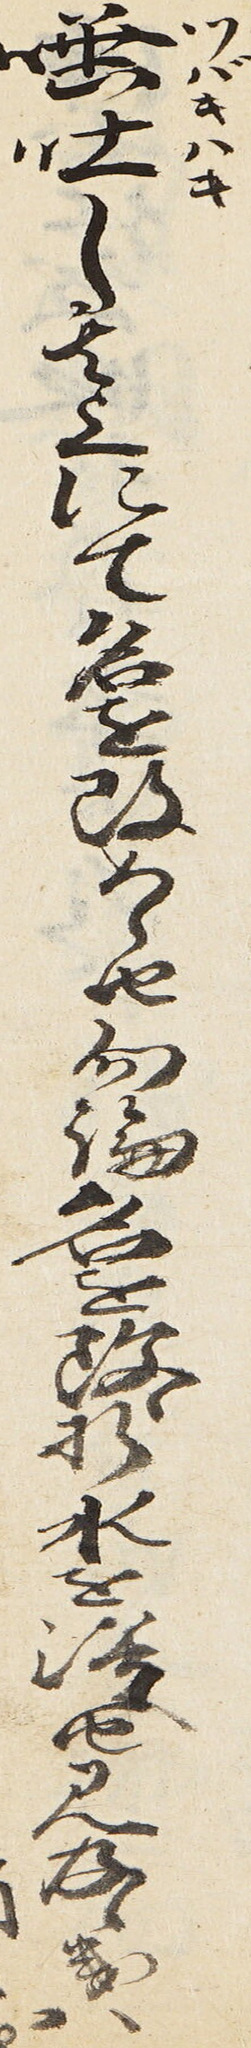唾吐し其上にて名を改め候由勿論名を改候打水を浴せ見及候義は有之哉
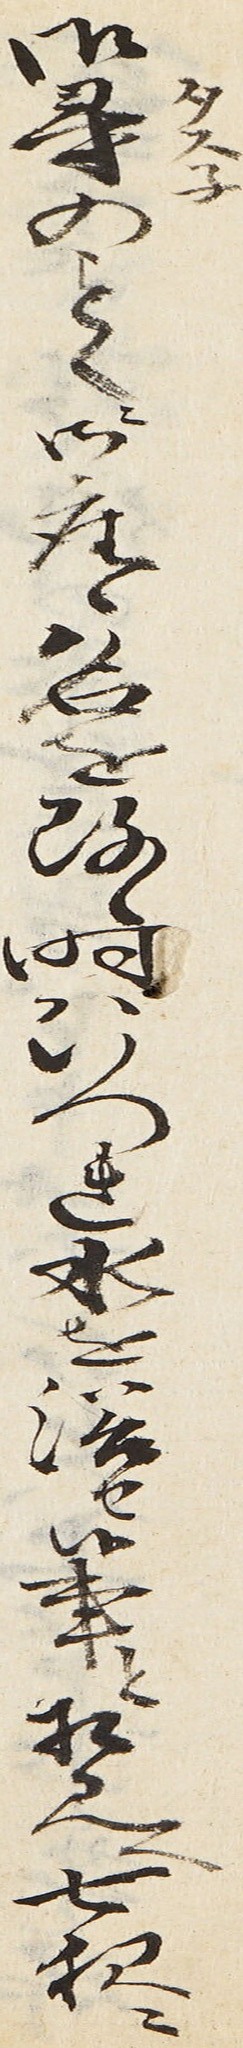御尋のことくに御座候名を改候時はいつれ水を浴せ候事と相見へ七夜に
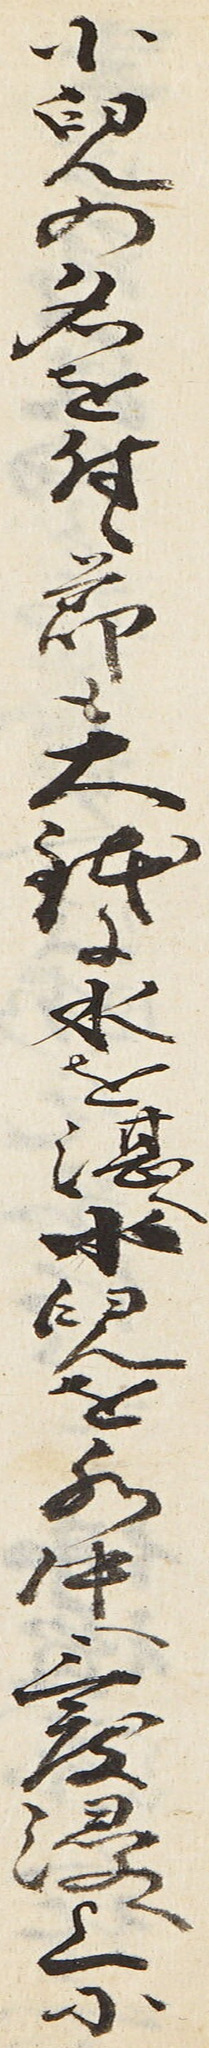小児の名を付候節も大鉢に水を湛へ小児を水中へ三度浸へ上に
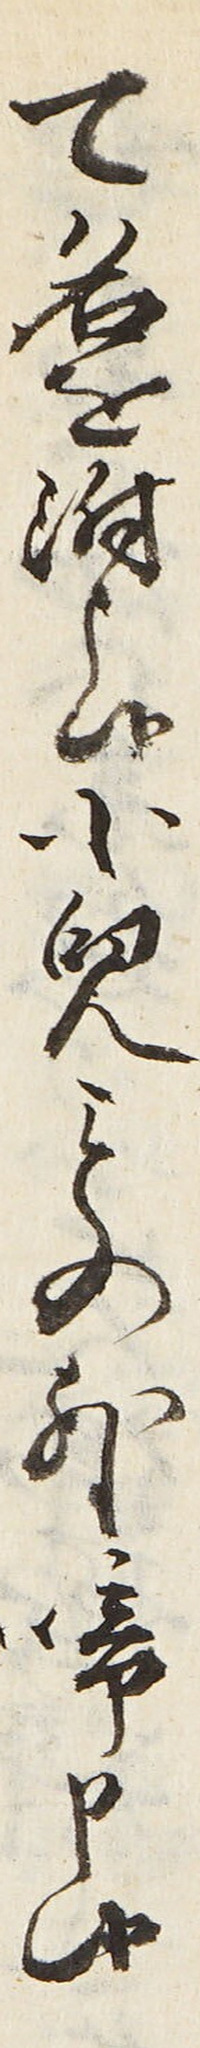て名を附申候小児ことの外啼申候
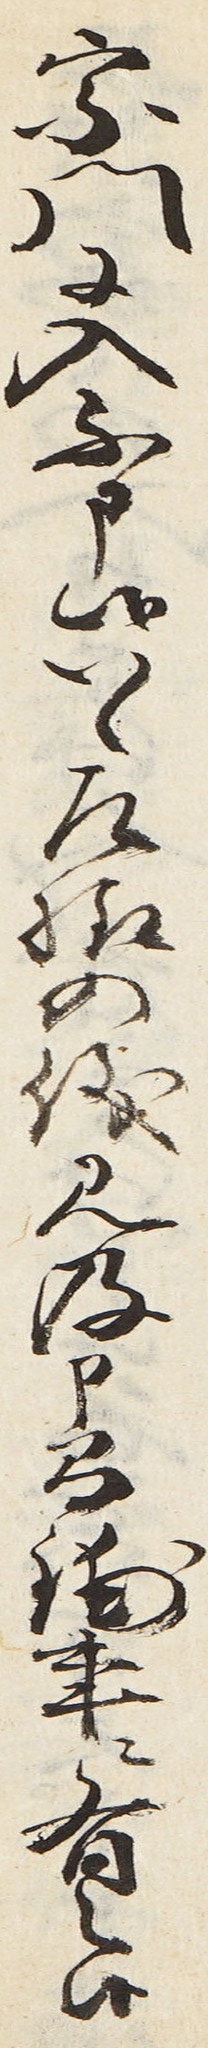宗門に入不申候はゝ左様の儀見及申間鋪事に有之候
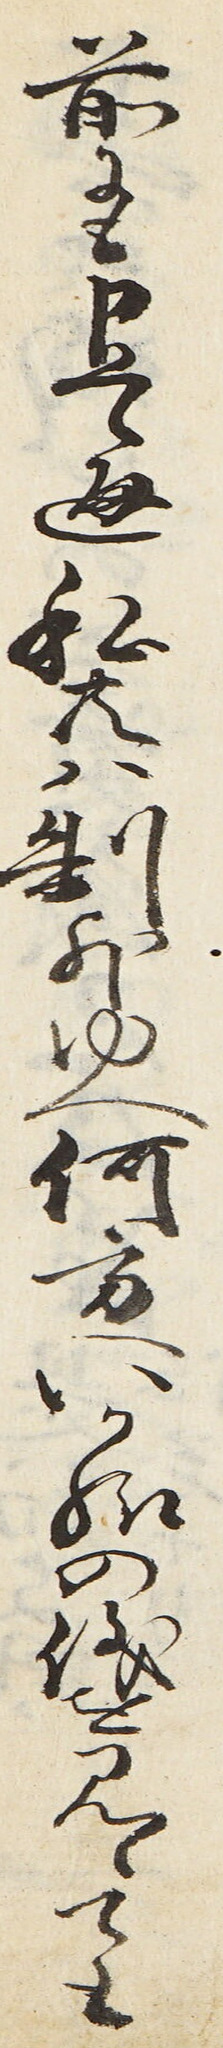前にも申上候通私共は制外ゆへ何方へいか様の儀を見候ても
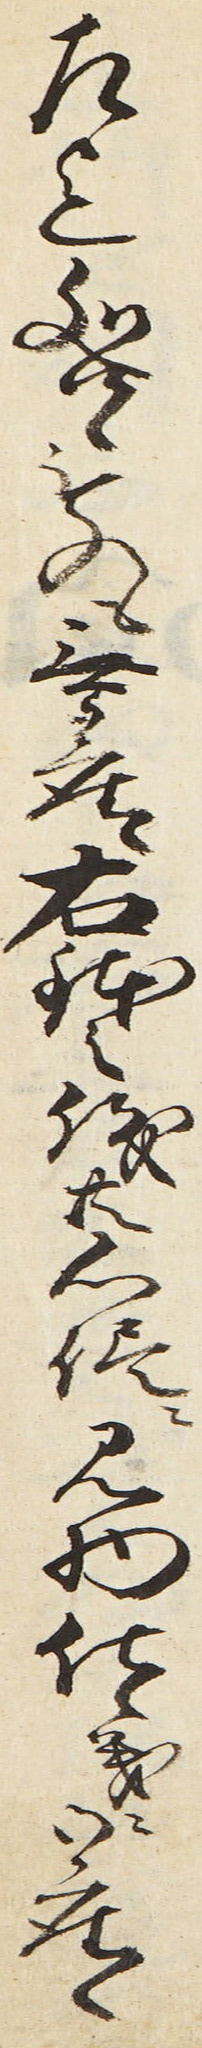左迄咎候ものも無御座候右躰之儀共心侭に見物仕候義に御座候

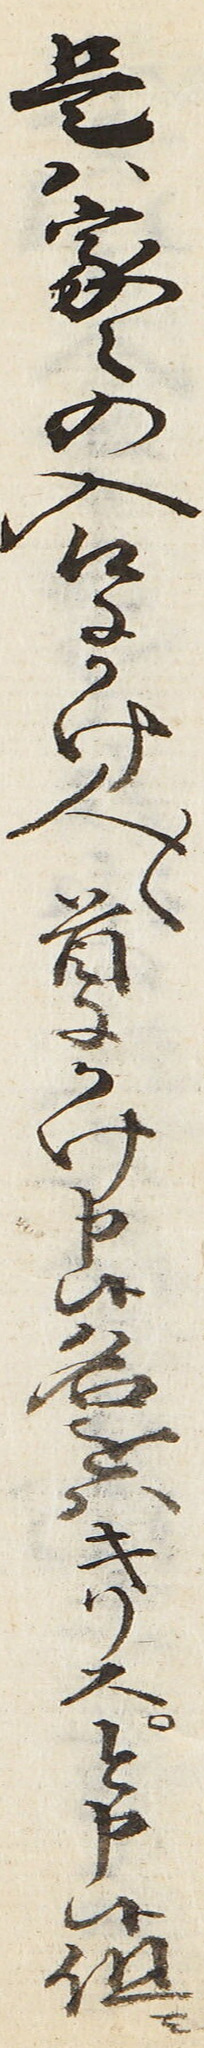是は家々の入口にかけ人〳〵首にかけ申候名をはキリス。と申候但し
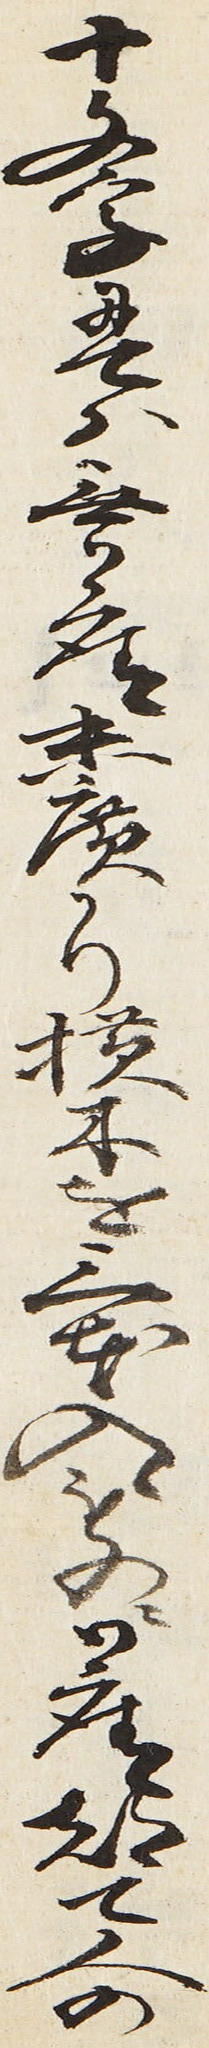十文字にては無御座候末広かり横木を三本入候ものに御座候都て人の
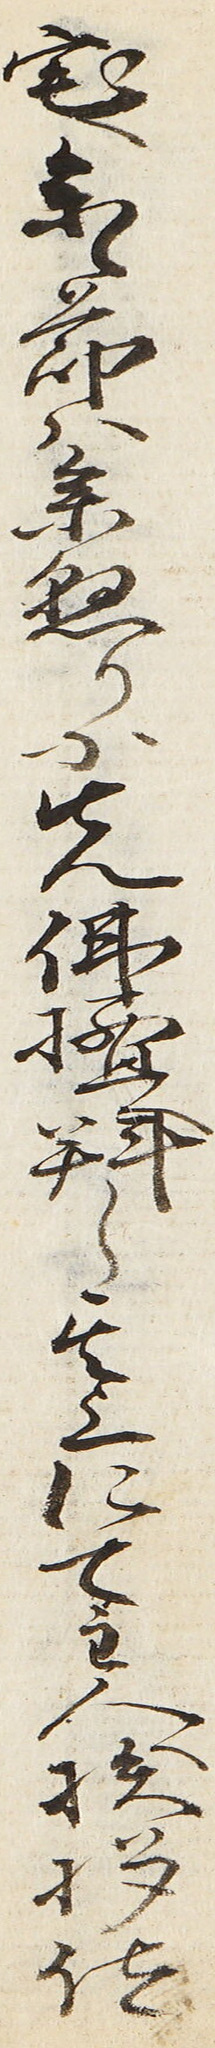宅へ参候節は参懸りに先仏壇へ拝し其上にて主人へ挨拶仕候
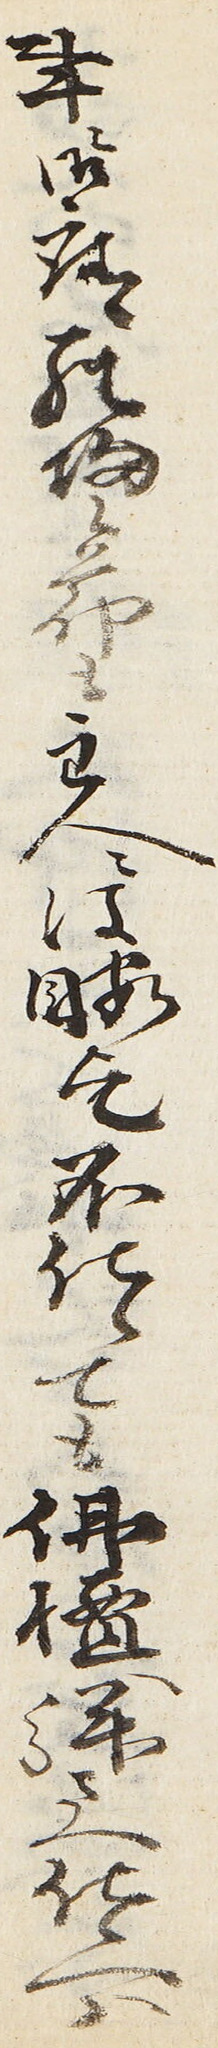事に御座候罷帰候節も主人には暇乞不仕候ても仏壇へ拝さへ仕候へは
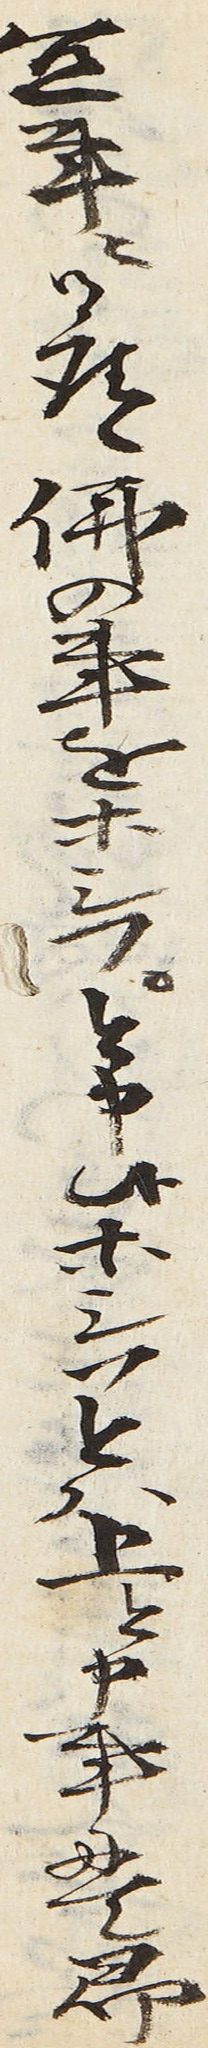宜事に御座候仏の事をホシフ。と申候ホシフとは上と申事にて即
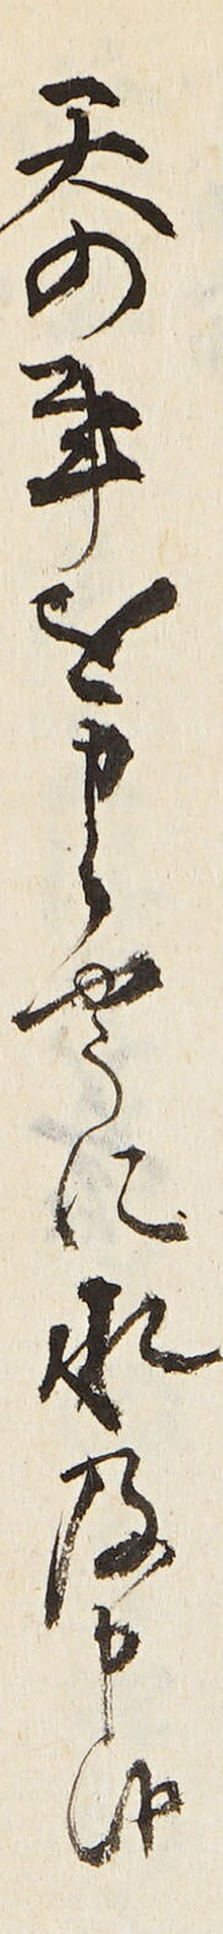天の事を申候やうに承及申候
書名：漂民御覧之記
